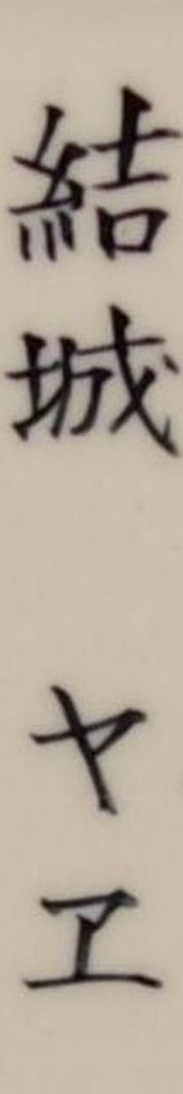結城ヤエ
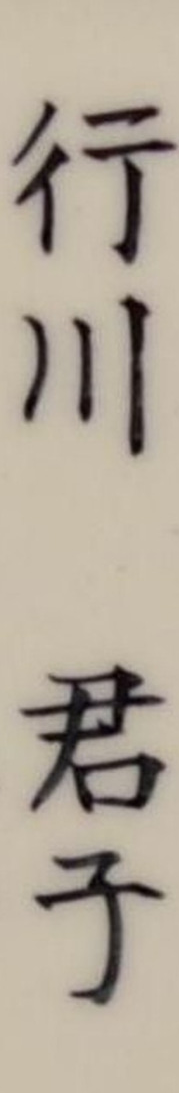行川君子
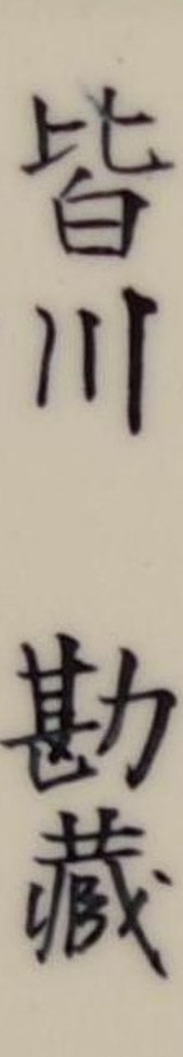皆川勘蔵
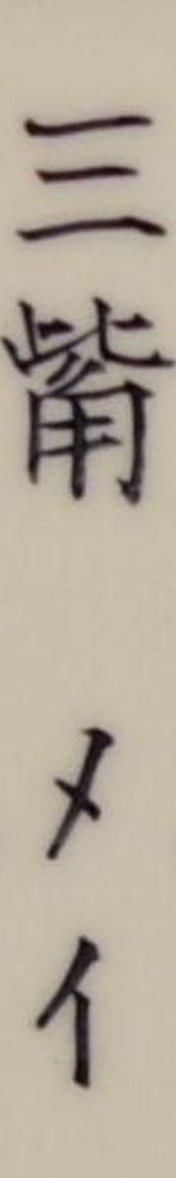三觜メイ
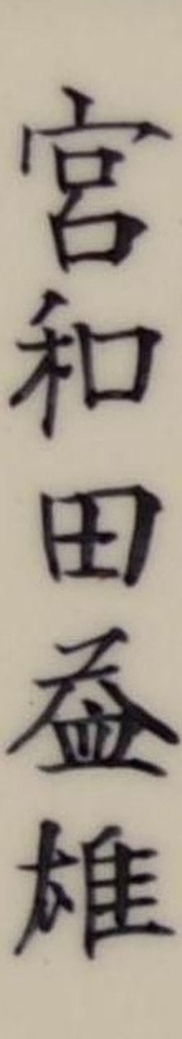宮和田益雄
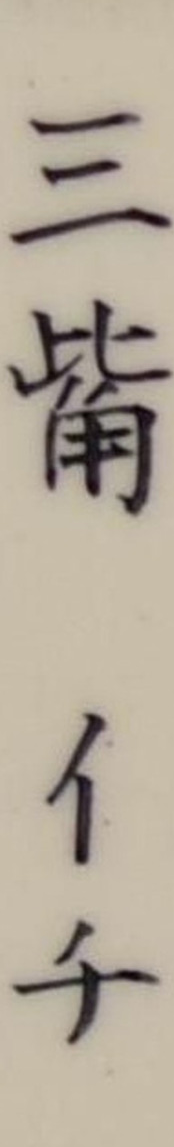三觜イチ
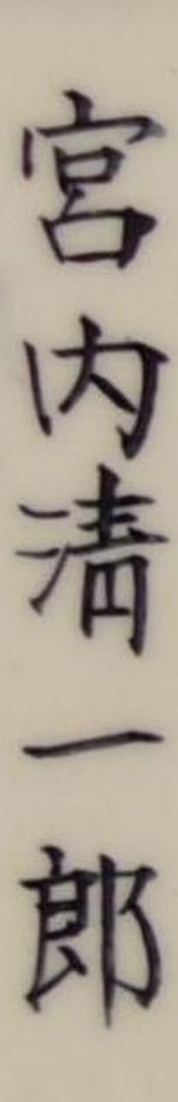宮内清一郎
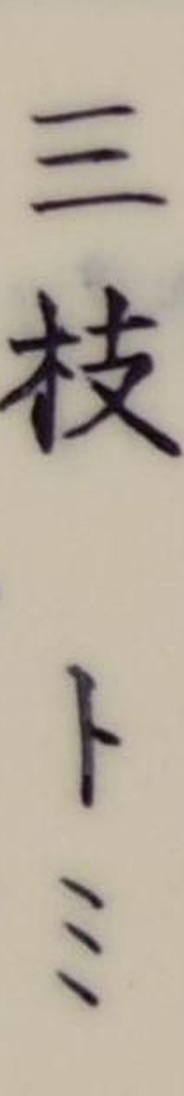三枝トミ
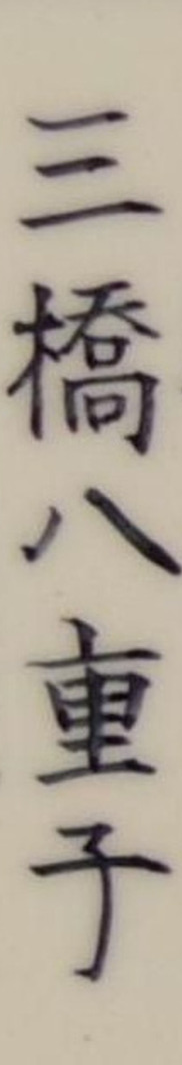三橋八重子
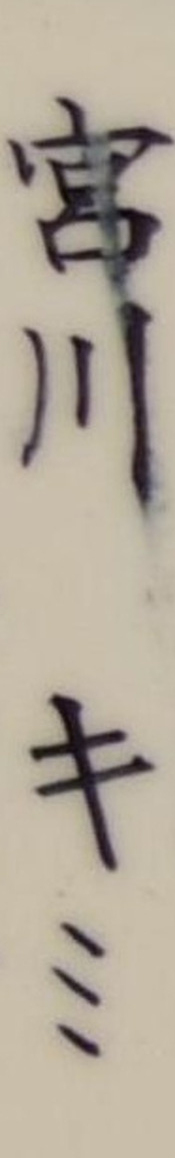宮川キミ
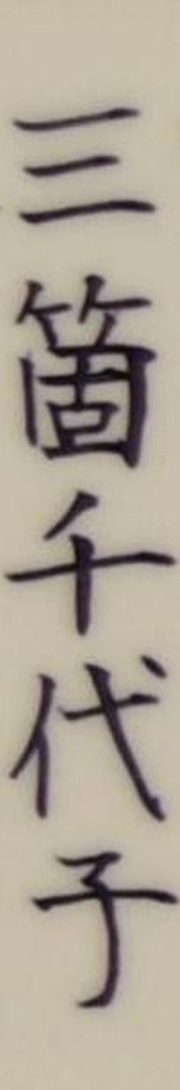三箇千代子
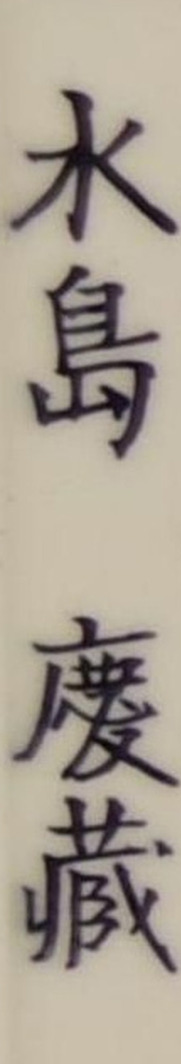水島慶蔵

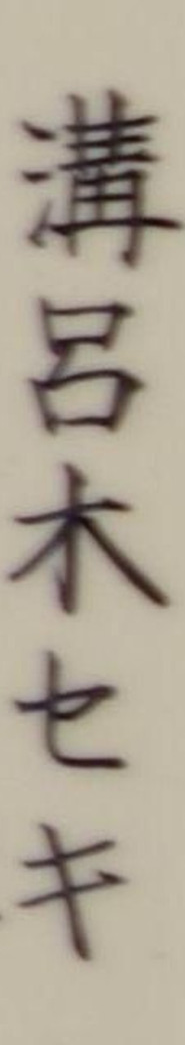溝呂木セキ
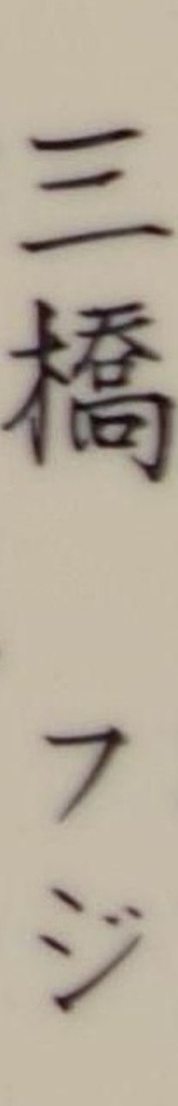三橋フジ
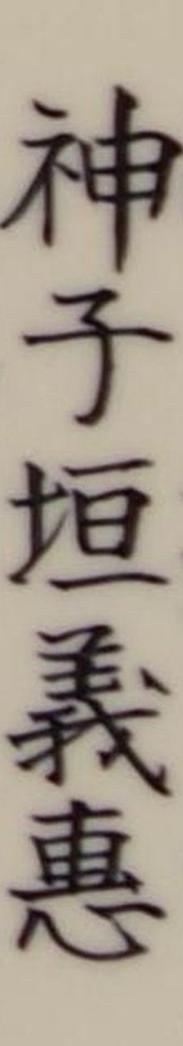神子垣義恵
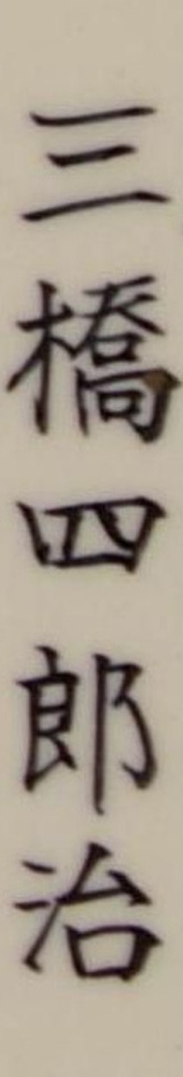三橋四郎治
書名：M~S
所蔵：高野山金剛峯寺
